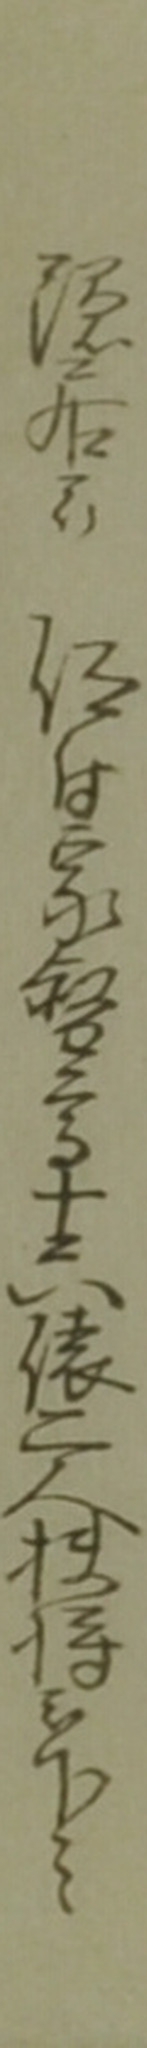隠居被仰付家督高十六俵二人扶持被下之
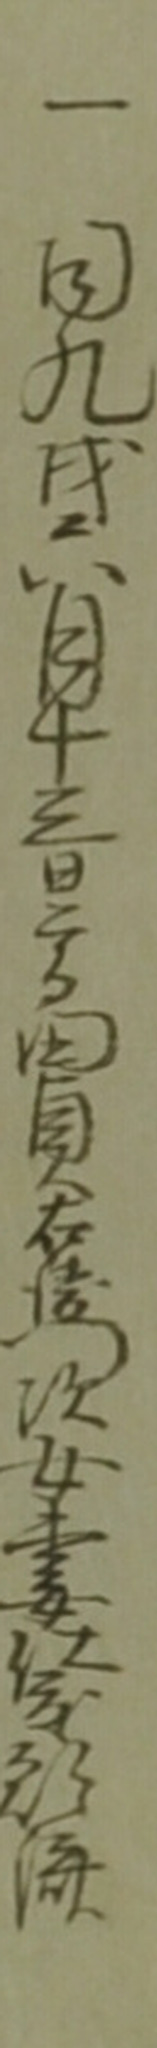一同九戌六月十三日高田貞右衛門次女妻仕度願済
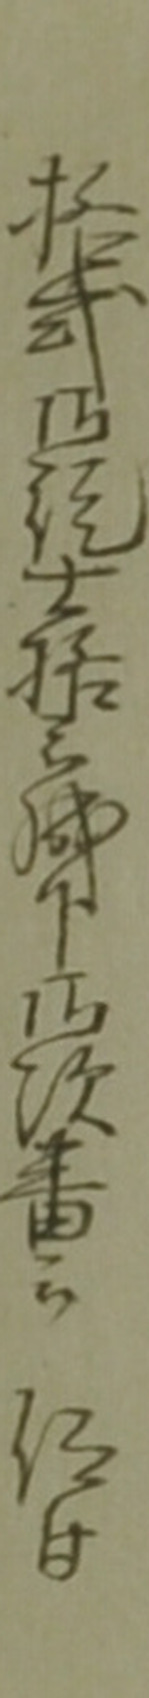格式御徒士格被成下御次番被仰付
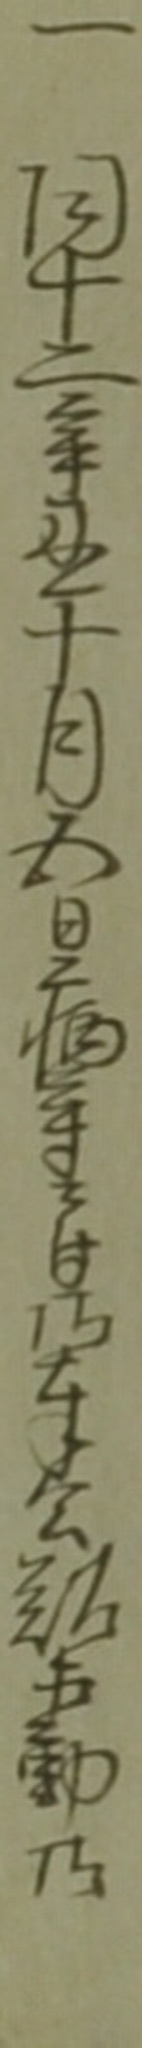一同十二辛丑十月五日病気ニ付奉公難相勤御
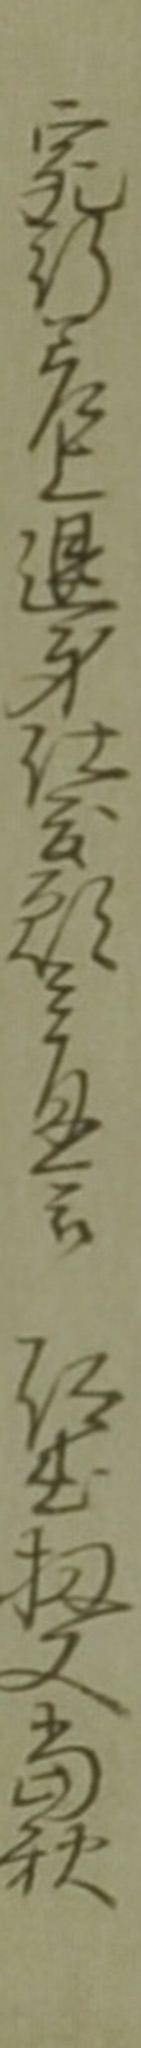宛行差上退身仕度願之通被仰出扨又当秋
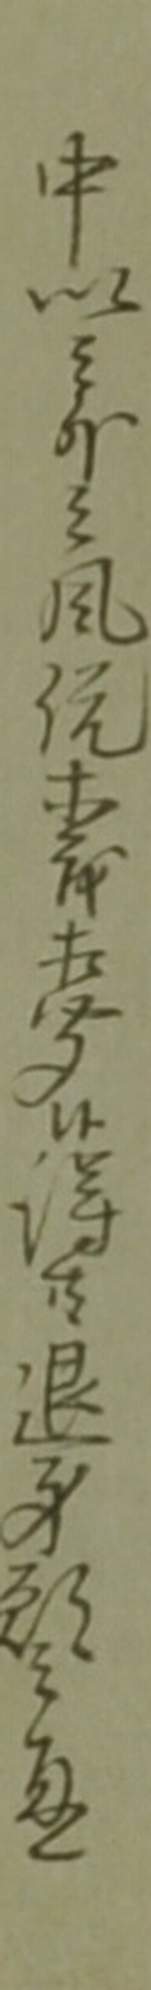中以之外之風説等茂相聞候得共退身願之通
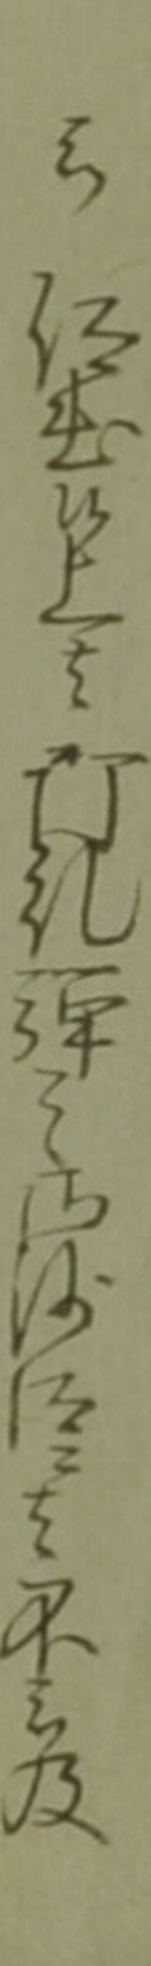被仰出候上者御糺弾之御沙汰ニ者不被及
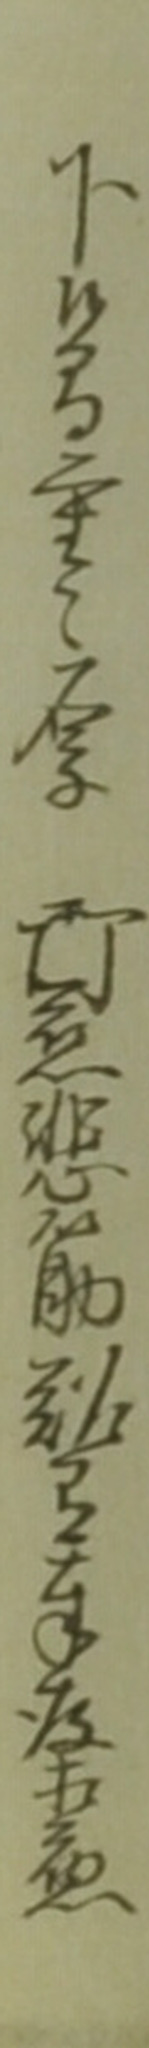下候間重々厚御慈悲筋難有奉存相応
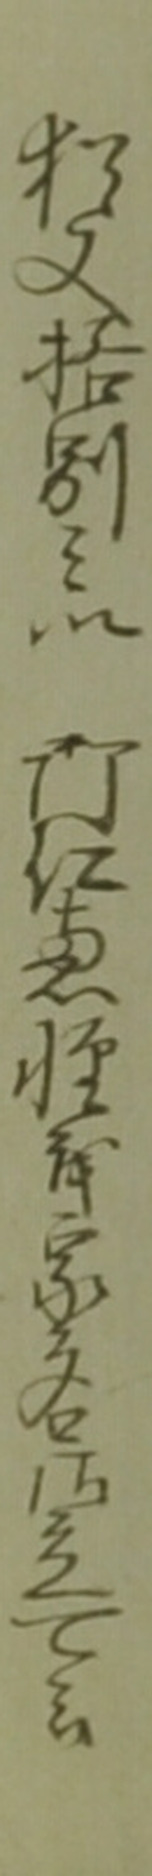猶又格別之以御仁恵軽茂家名御立可被

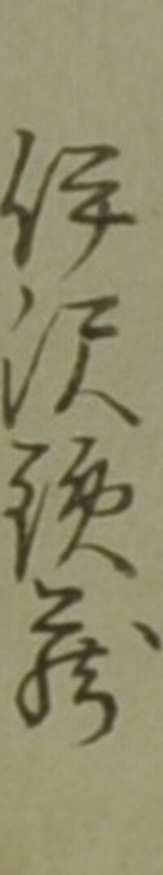伊沢鉄蔵

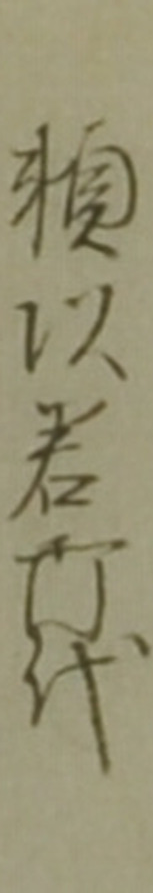頼以君御代
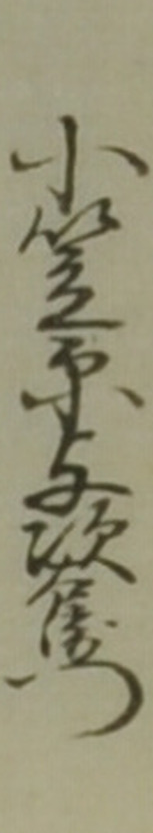小笠原与次右衛門
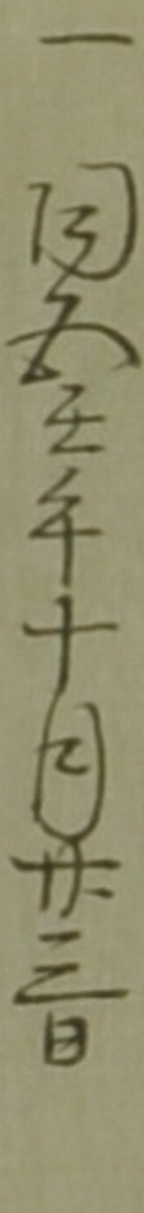一同五壬午十月廿三日
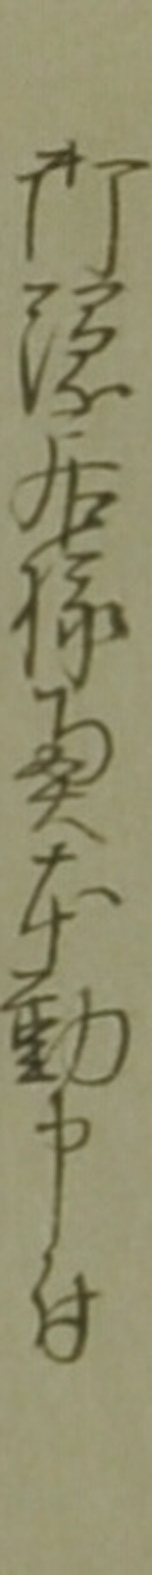御隠居様奥本勤申付
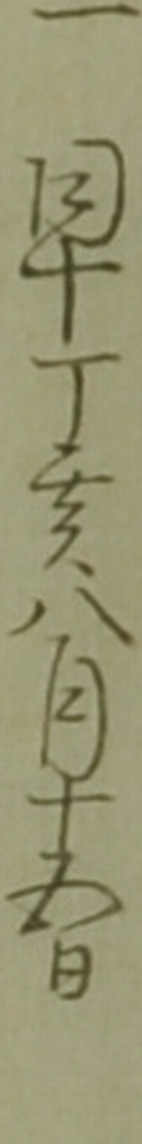一同十丁亥八月十五日
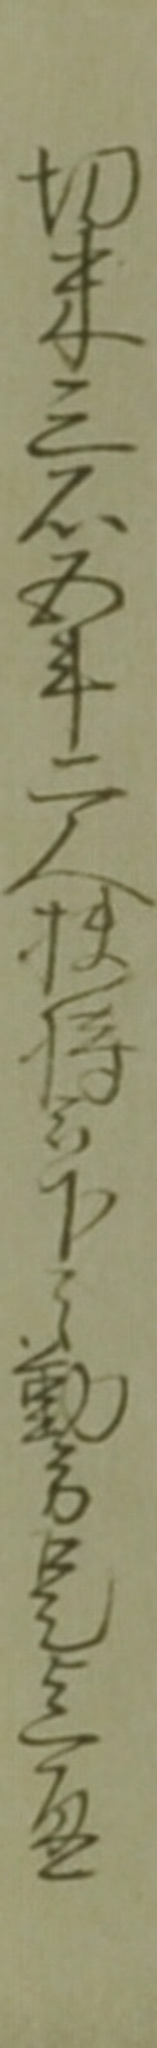切米三石五斗二人扶持被下之勤方是迄之通
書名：無足諸士勤仕録（九）
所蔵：伊那市立高遠町図書館・合同会社AMANE
